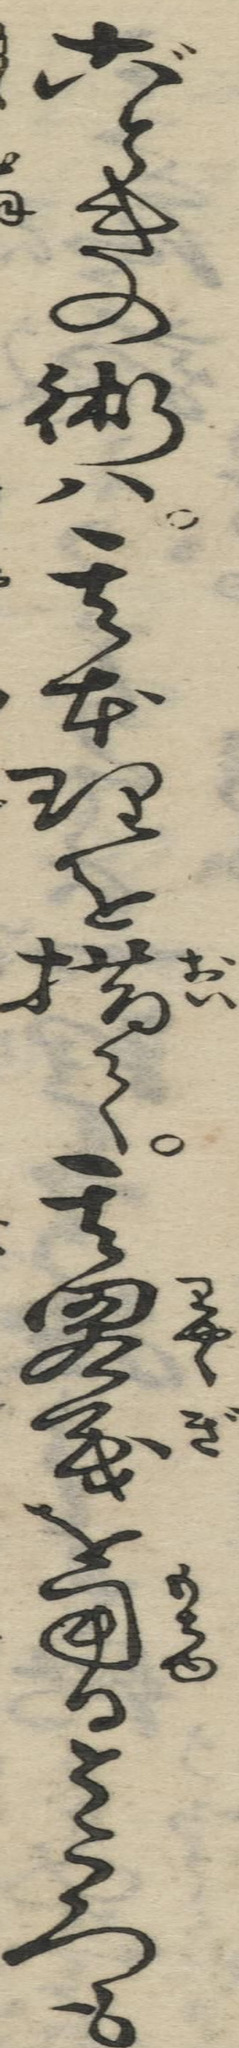ごときの術は。其本理を措て。其略儀を用るところも
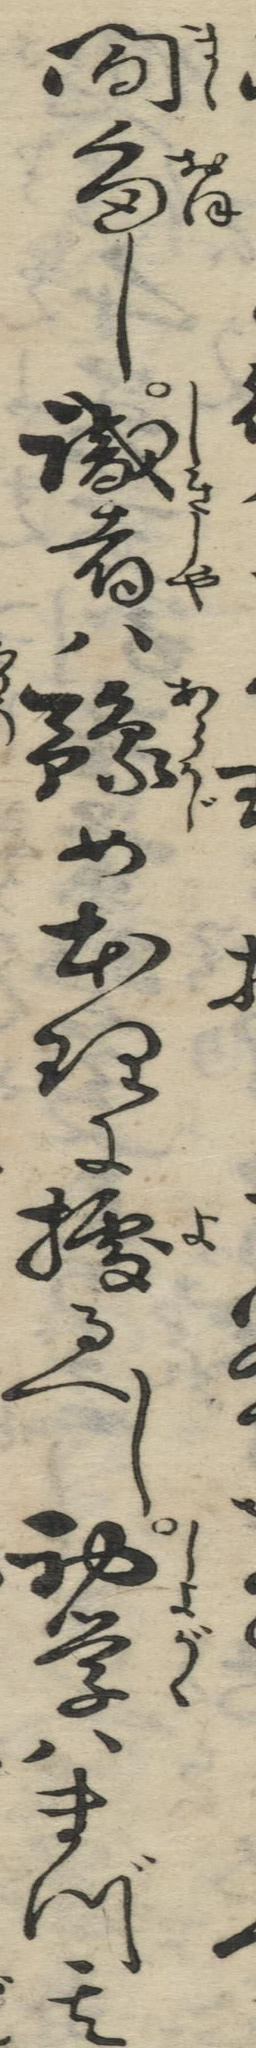間多し。識者は予め本理に拠るへし。初学はまづ其
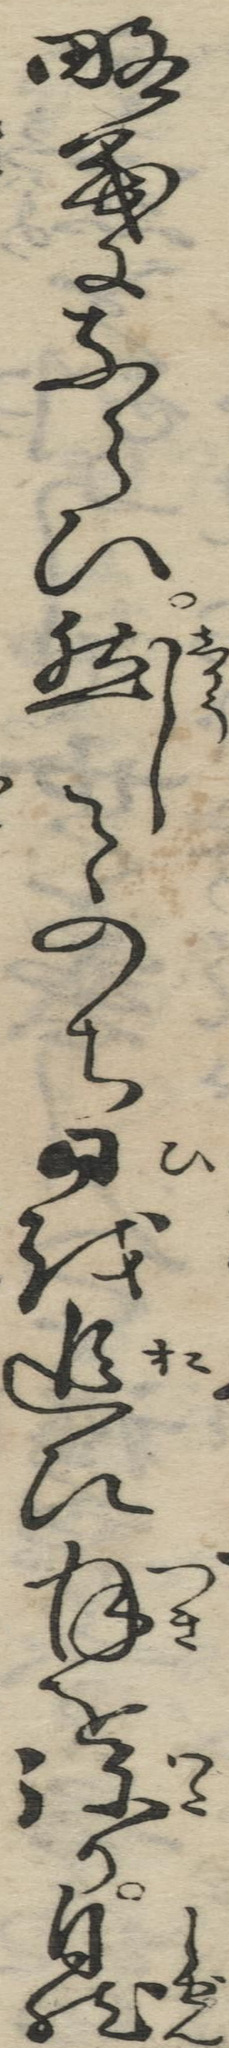略義にならひ。然してのち日を追ひ月を渡り。自然
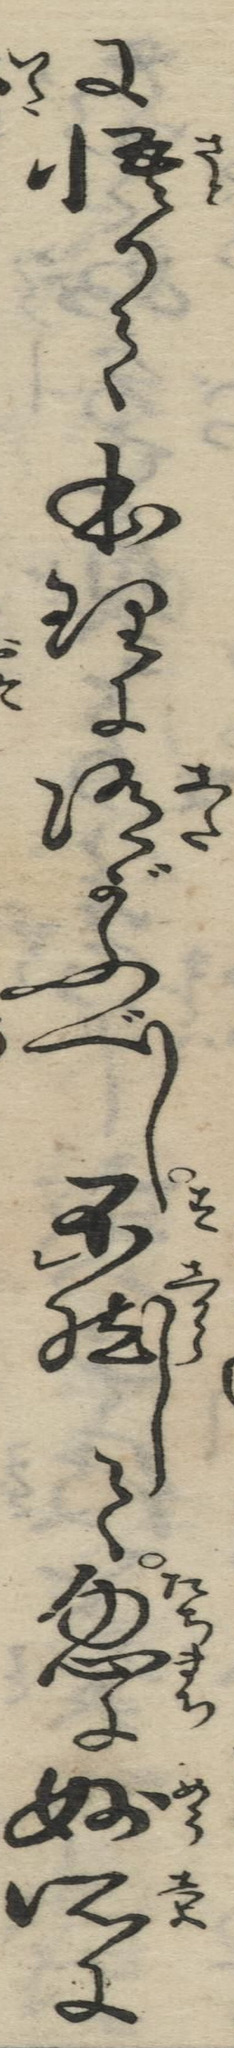に悟りて本理に従がふべし。不然して。忽に妙所に
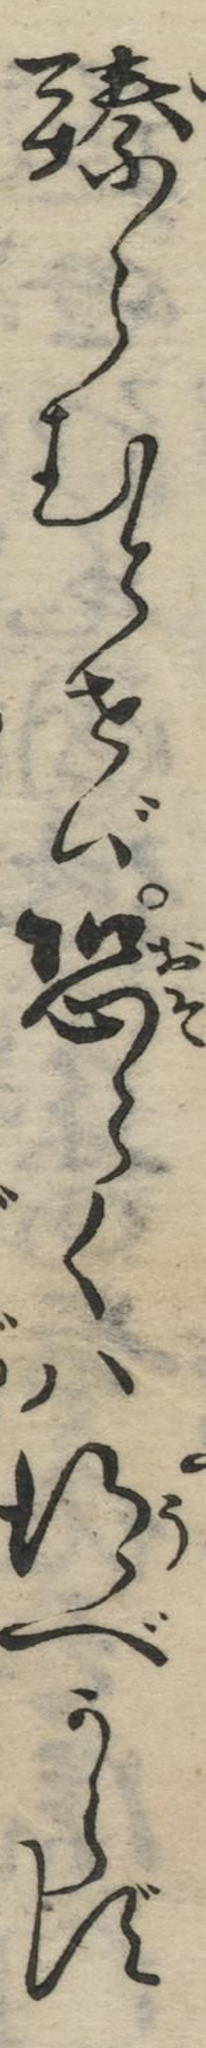臻らむとせば。恐らくは得べからず
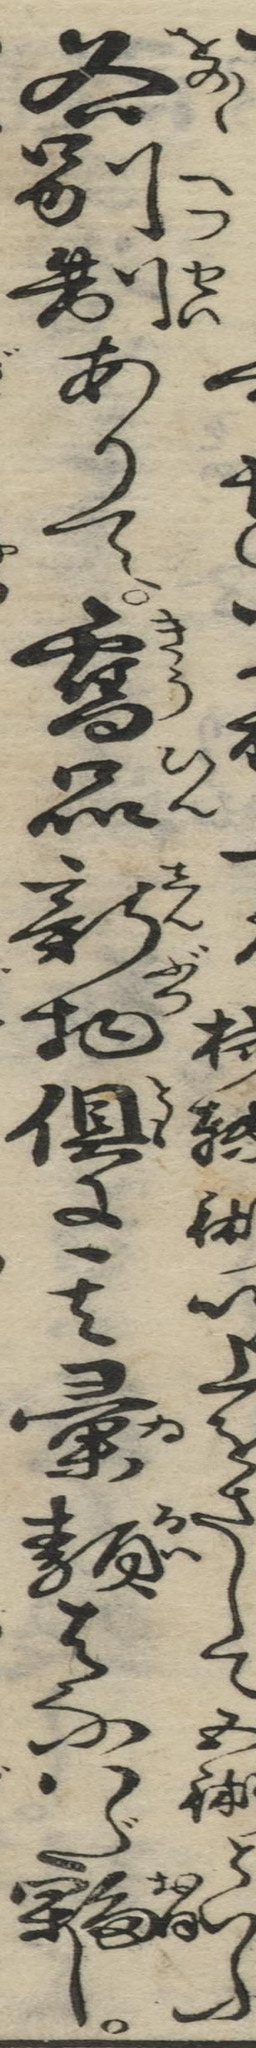各別制ありて。旧品新物倶に其彙類はなはだ夥し。
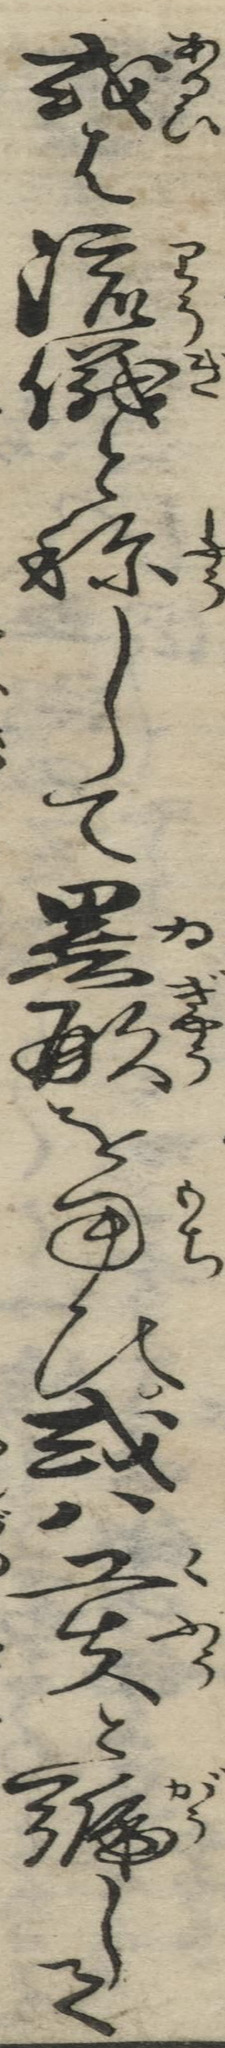或は流儀と称して異形を用ひ或は工夫と号して
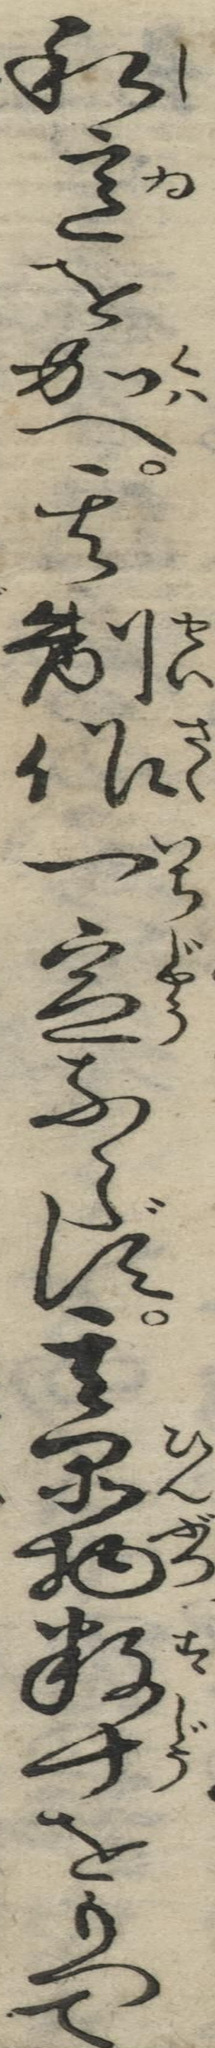私意を加へ。其制作一定ならず。其品物数十をもつて

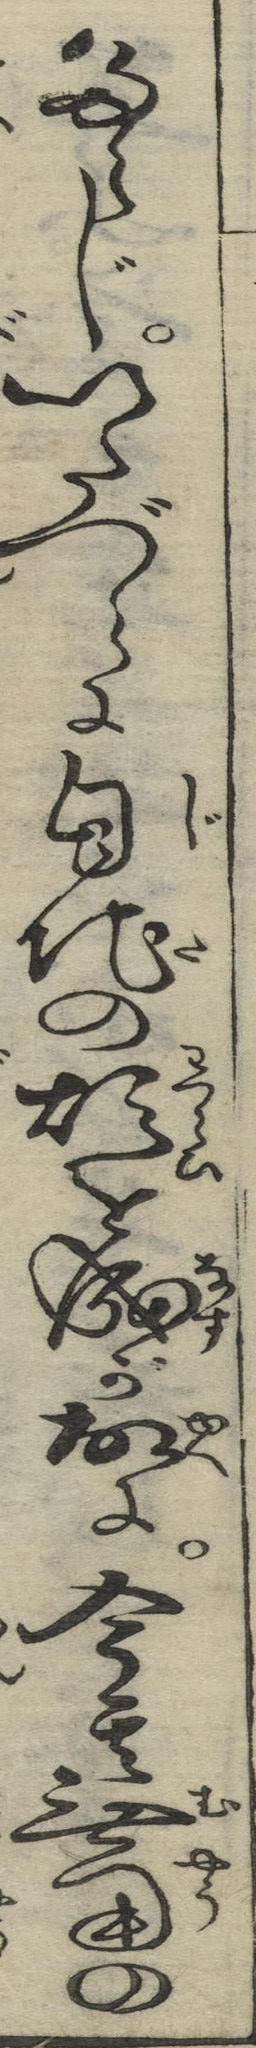たらじ。いたづらに自他の煩を成すが故に。今其無用の
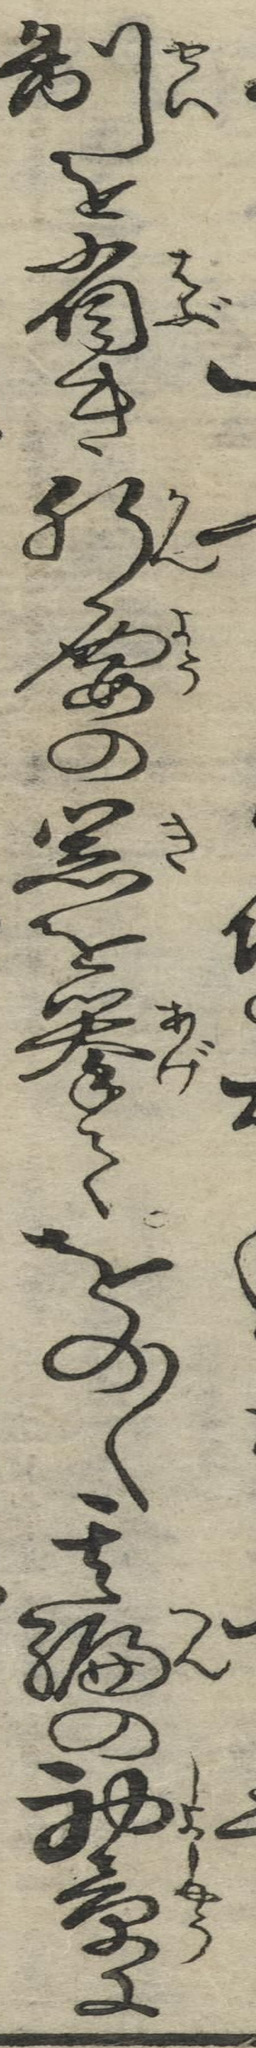制を省き肝要の器を挙てをの〳〵其編の初章に
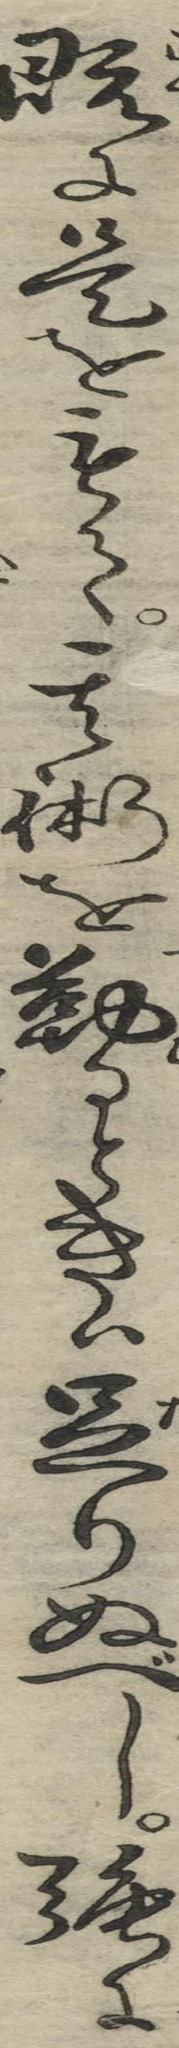既に是をもて。其術を勤るときは足りぬべし。強に
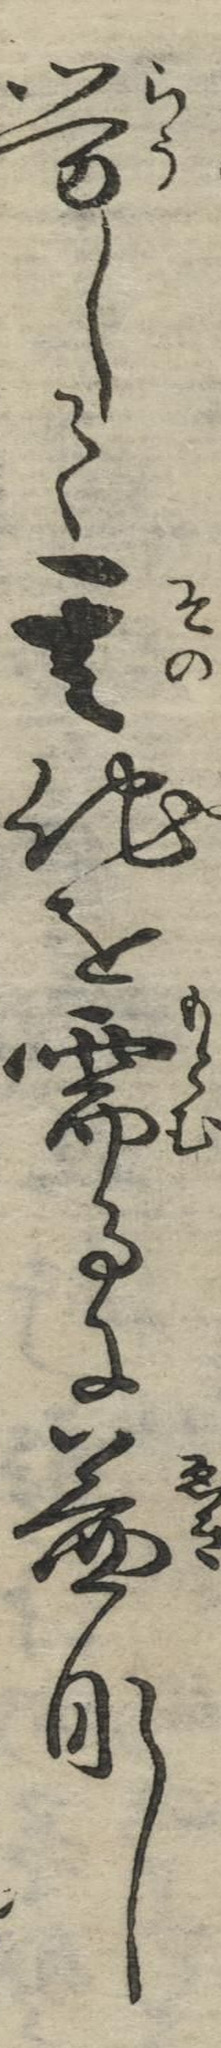労して其他を需るに益なし
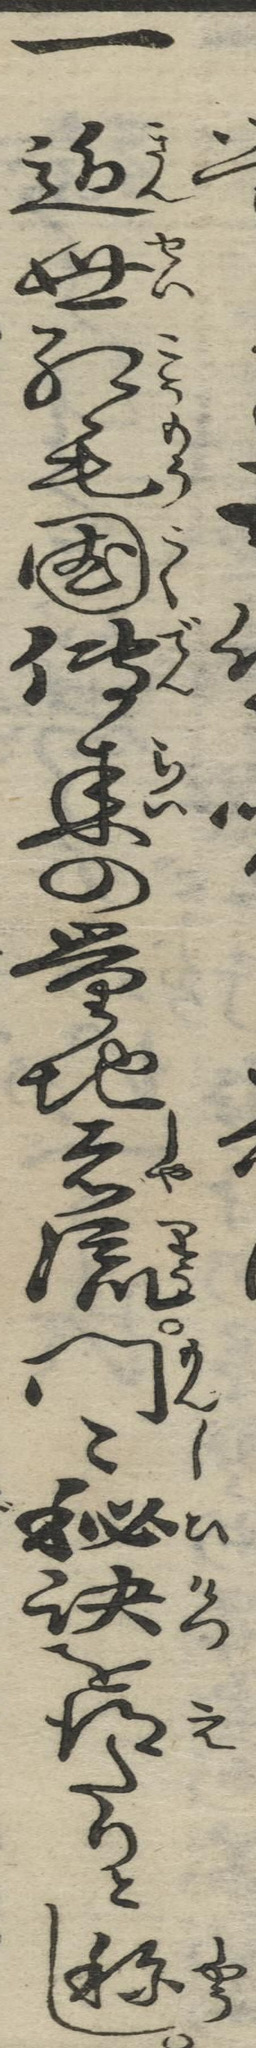一近世紅毛国伝来の量地者流。門〻秘訣を得たりと称し。
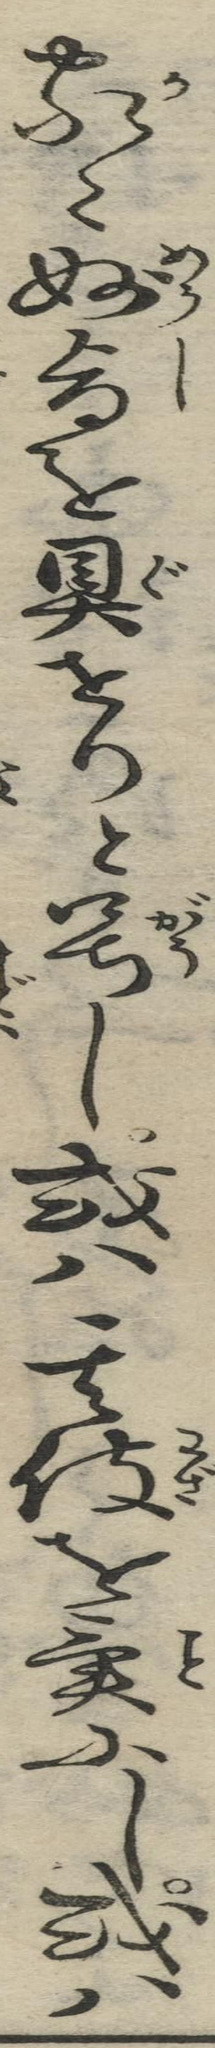家〻妙旨を具せりと号し或は其技を異にし。或は
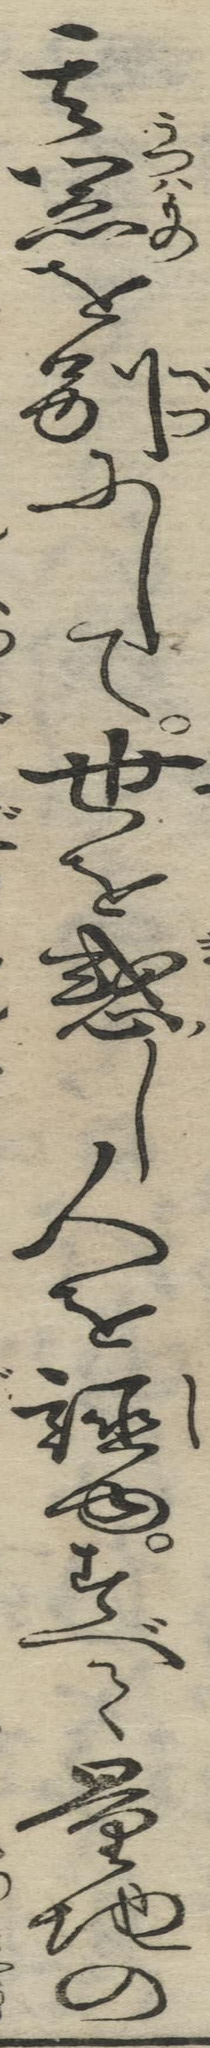其器を別にして。世を惑し人を誣ゆ。すべて量地の
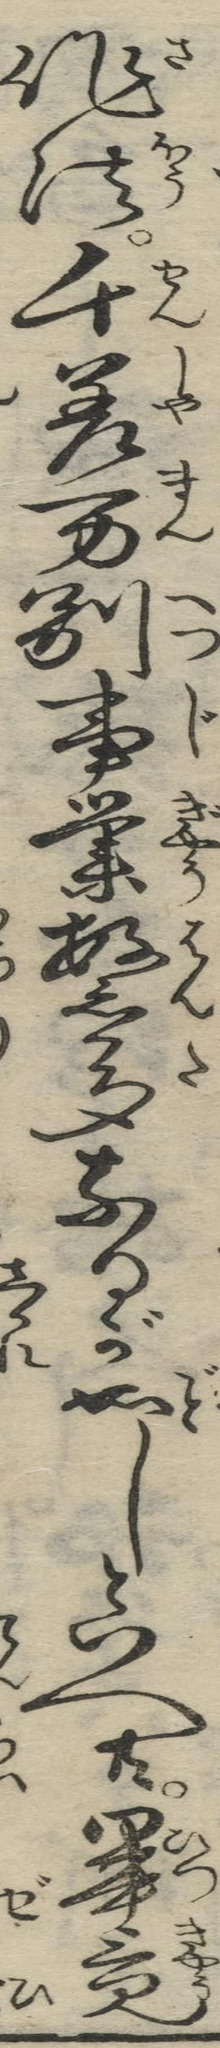作法。千差万別事業繁多なるが如しといへども。畢竟
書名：量地指南　巻之一（内題）
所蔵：東京大学地震研究所図書室 Earthquake Research Institute Library, The University of Tokyo, JAPAN
